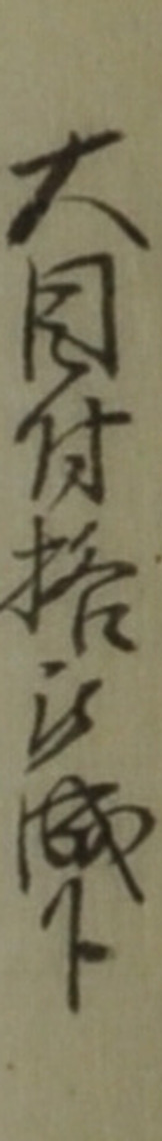大目付格被成下
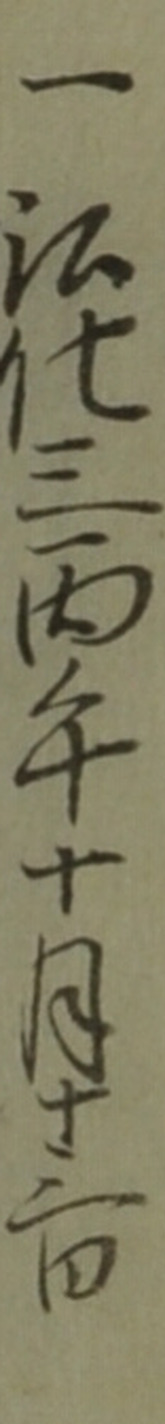一弘化三丙午十月十三日
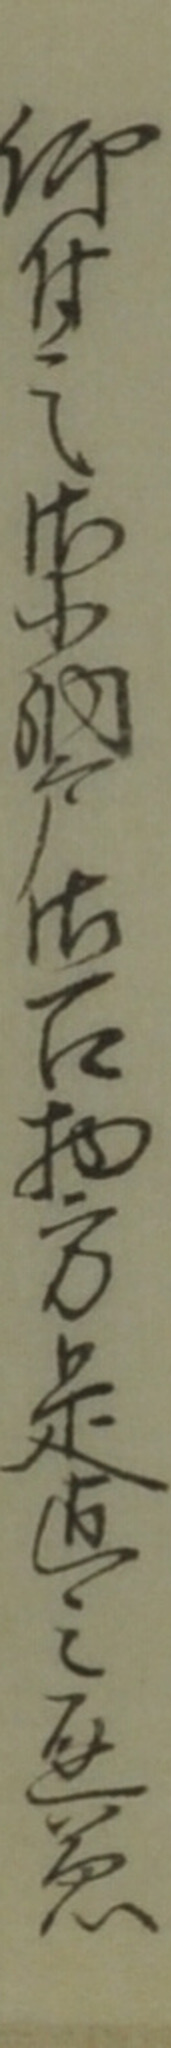仰付之御小納戸御召物方是迄之通兼
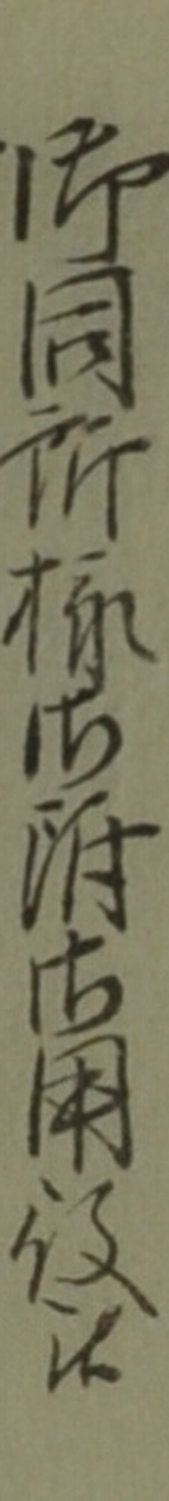御同所様御附御用役被
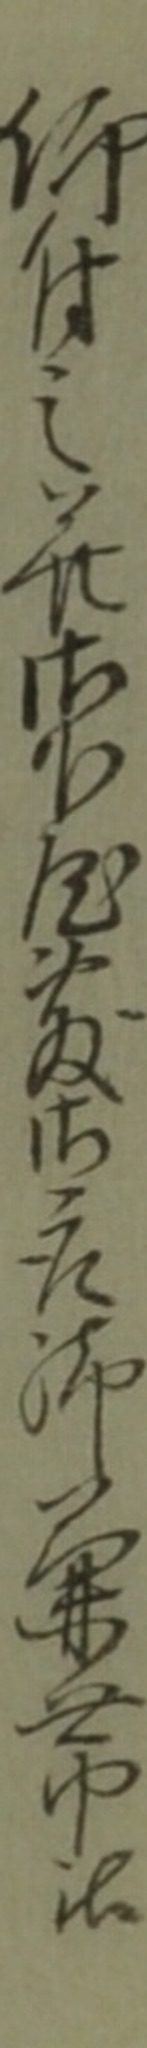仰付之并御下屋敷御取締兼帯被
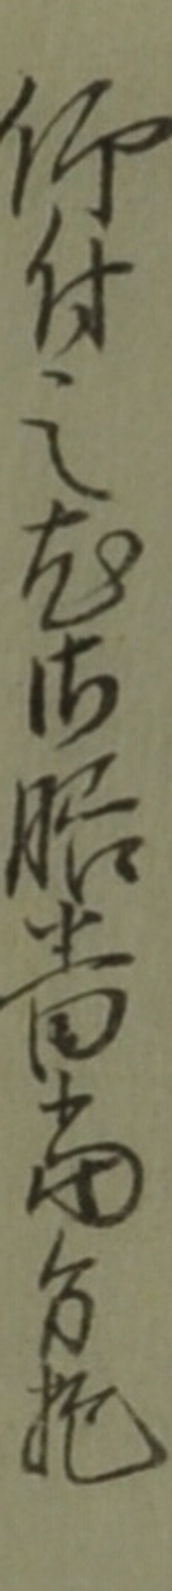仰付之尤御膳番当分抱
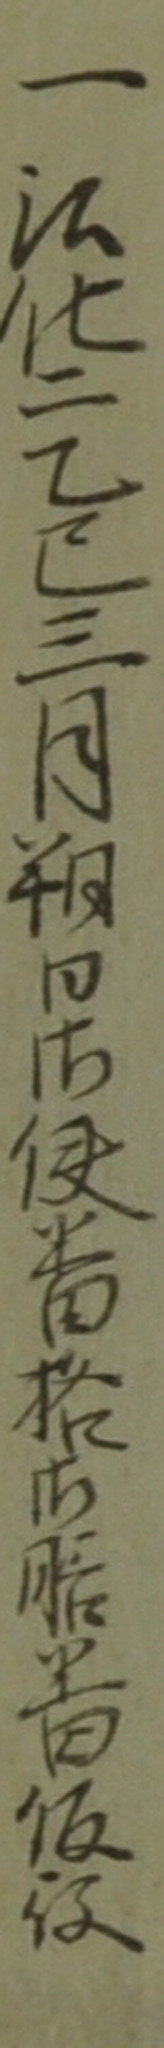一弘化二乙巳三月朔日御使番格御膳番仮役
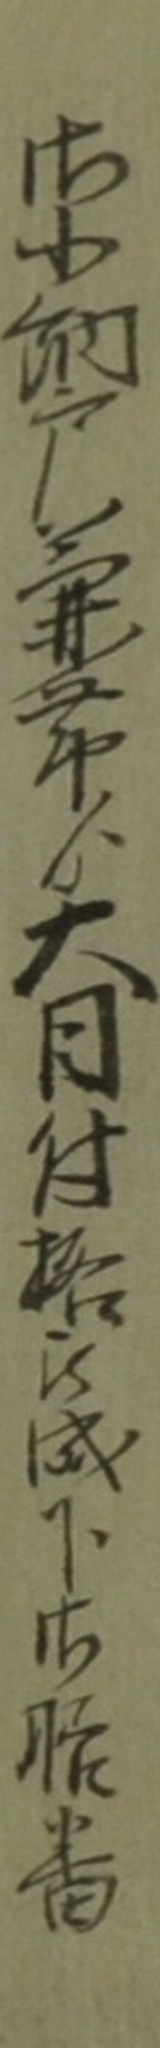御小納戸兼帯ゟ大目付格被成下御膳番
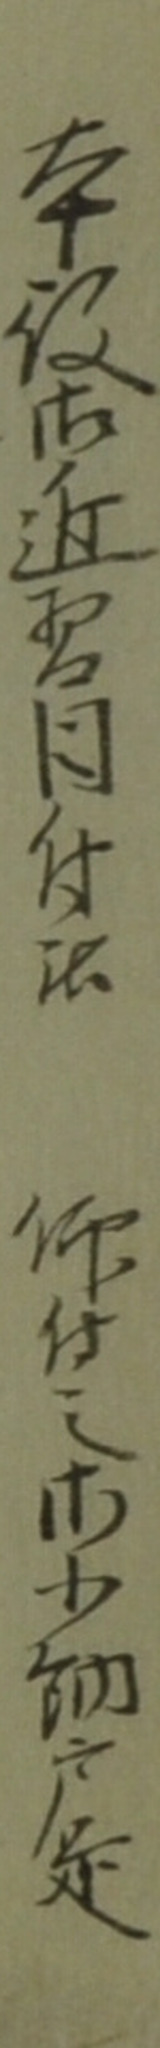本役御近習目付被仰付之御小納戸是
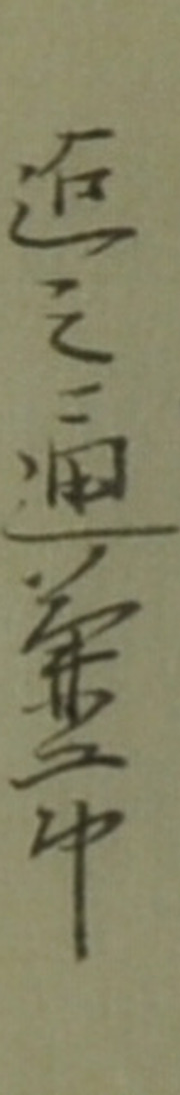迄之通兼帯

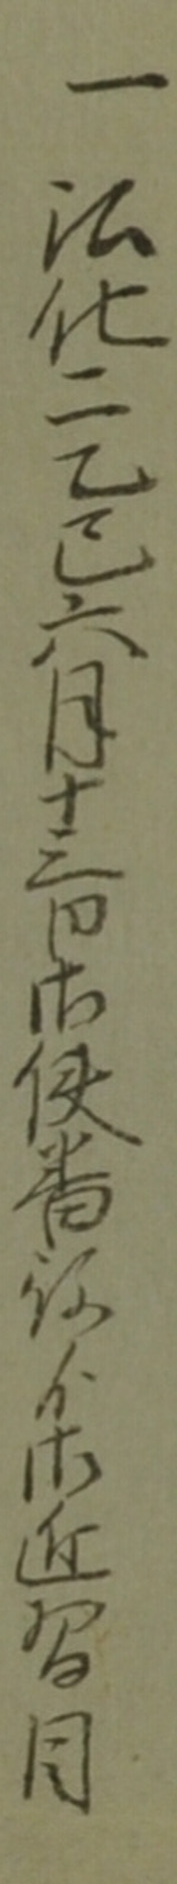一弘化二乙巳六月十三日御使番役ゟ御近習目
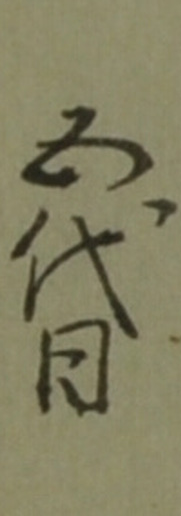五代目
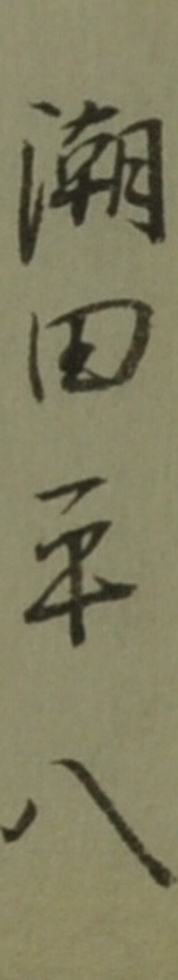潮田平八
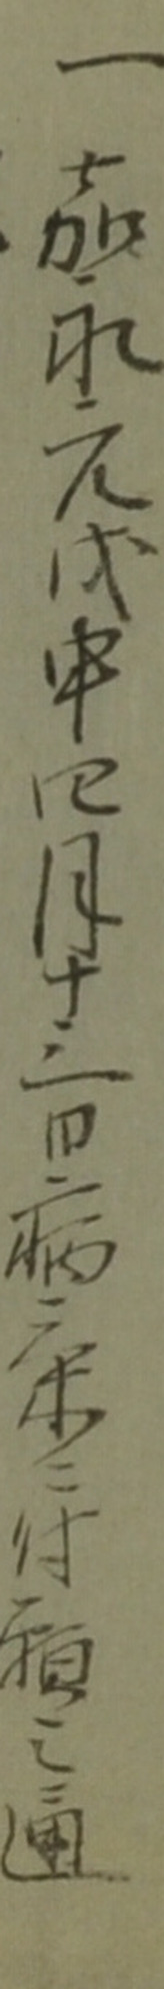一嘉永元戊申四月十三日病気ニ付願之通
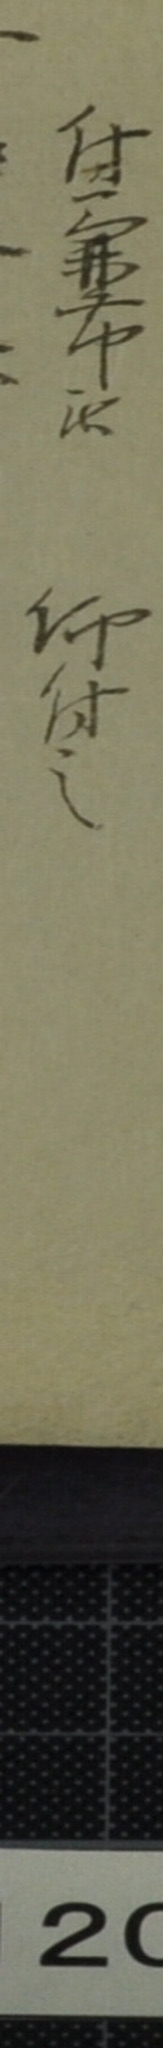付兼帯被仰付之
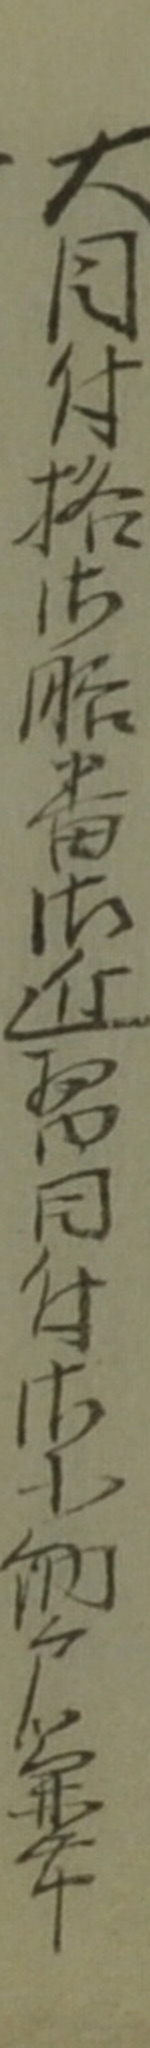大目付格御膳番御近習目付御小納戸兼帯
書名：諸御役代々録（四）
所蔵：伊那市立高遠町図書館・合同会社AMANE
